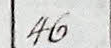46
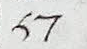57
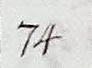74
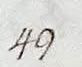49
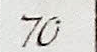70
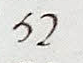52
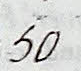50
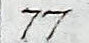77
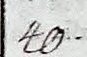40
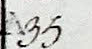35
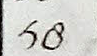58
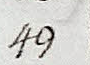49
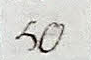50
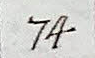74
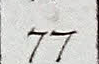77
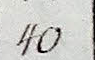40
